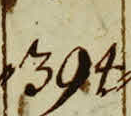394
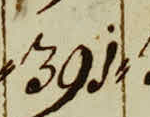391
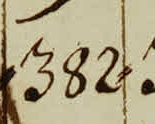382
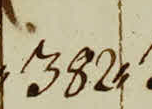382
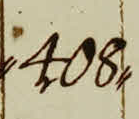408
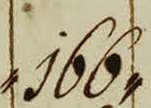166
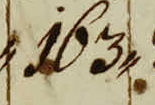163
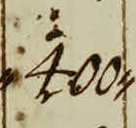400
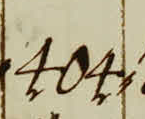404
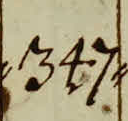347
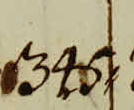345
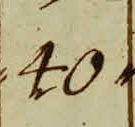40
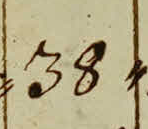38
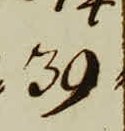39
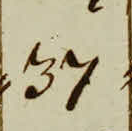37
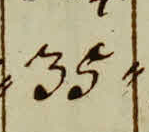35
